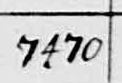7470
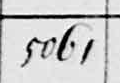5061
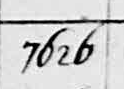7626
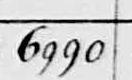6990
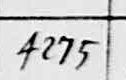4275
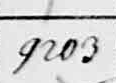9203
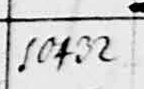10432
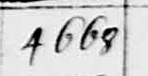4668
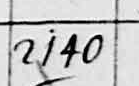2140
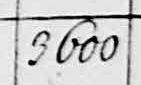3600
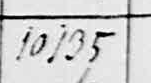10135
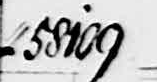58109
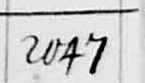2047
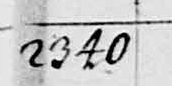2340
